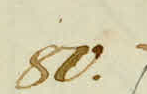80.
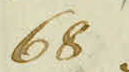68
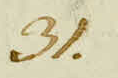31.
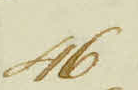46
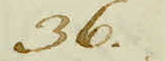36.
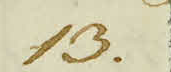13.
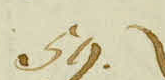59.
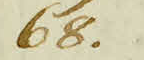68.
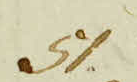51.
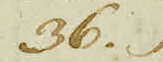36.
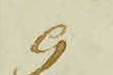9
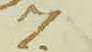7.
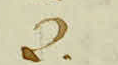2.
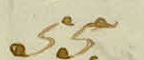55
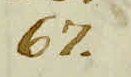67.
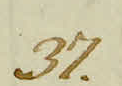37.
